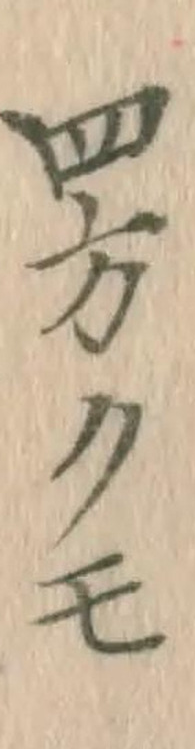四方クモ
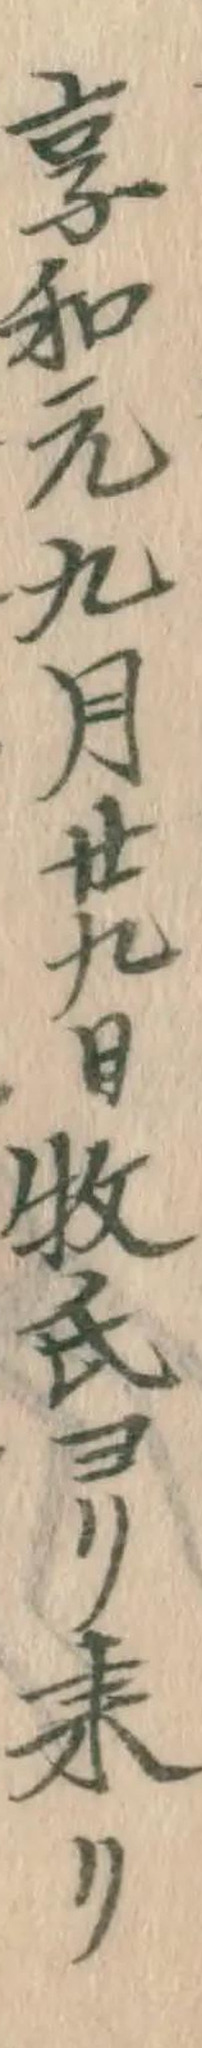享和元九月廿九日牧氏ヨリ来リ
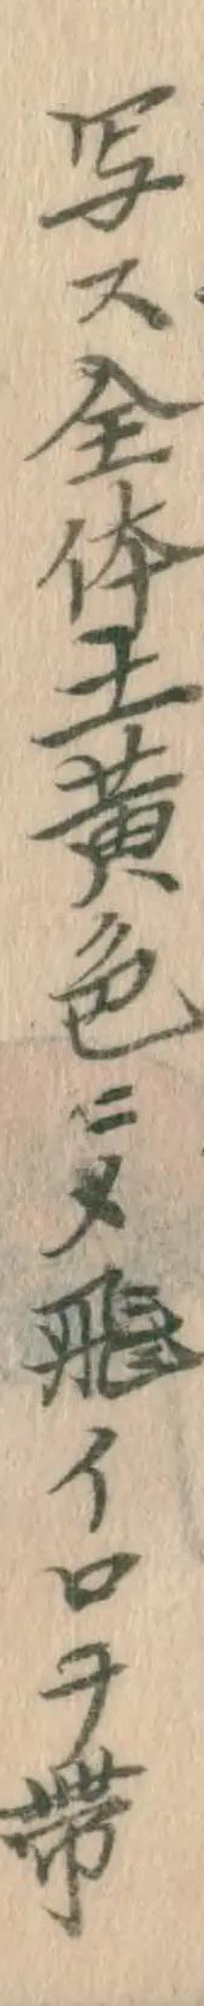写ス全体土黄色ニシテ飛イロヲ帯
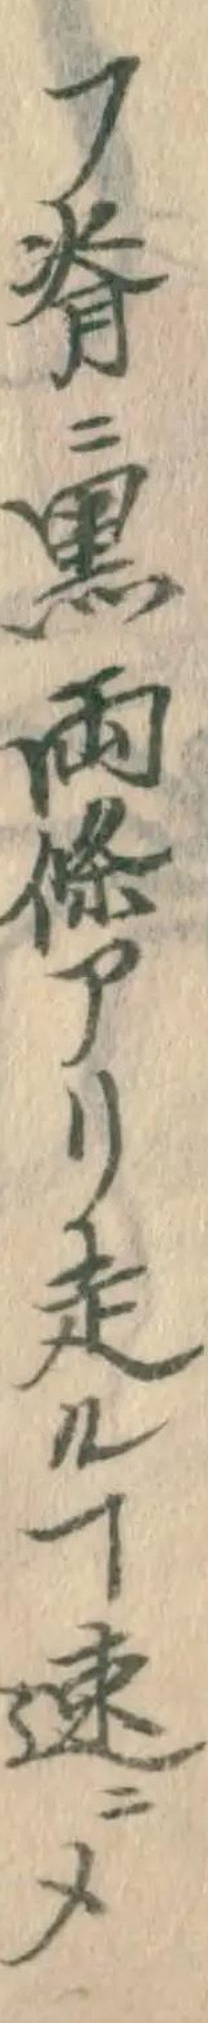フ脊ニ黒両條アリ走ルコト速ニシテ
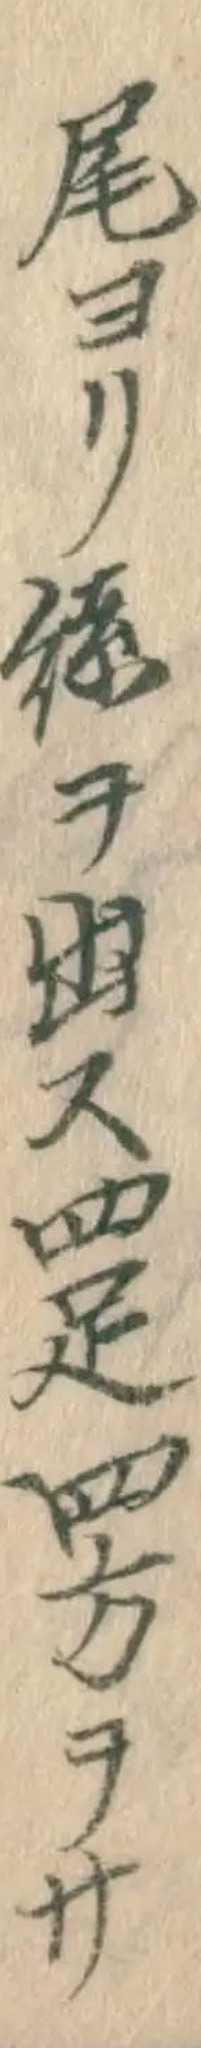尾ヨリ絲ヲ出ス四足四方ヲサ
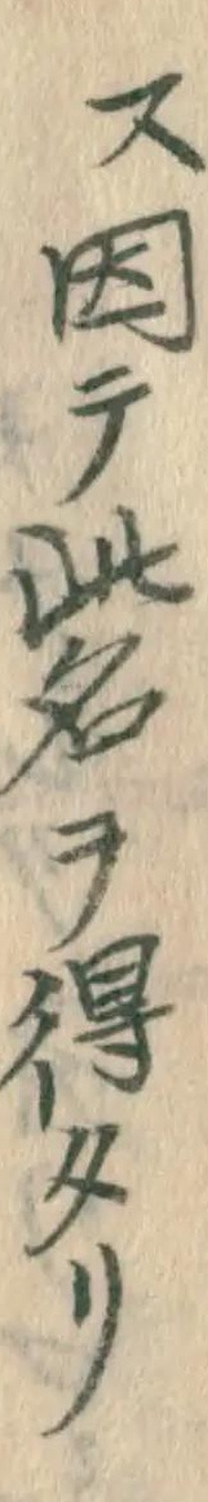ス因テ此名ヲ得タリ

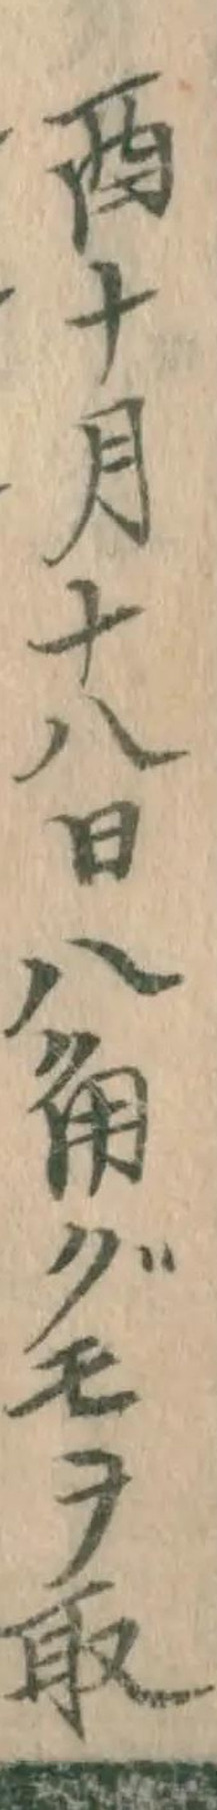酉十月十八日八角グモヲ取
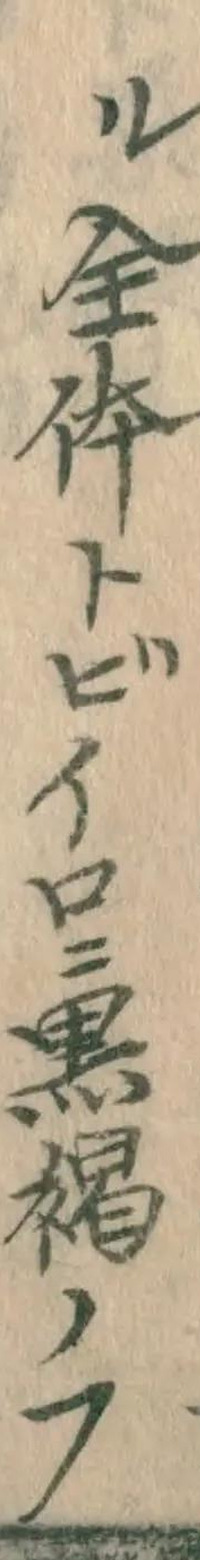ル全体トビイロニ黒褐ノフ
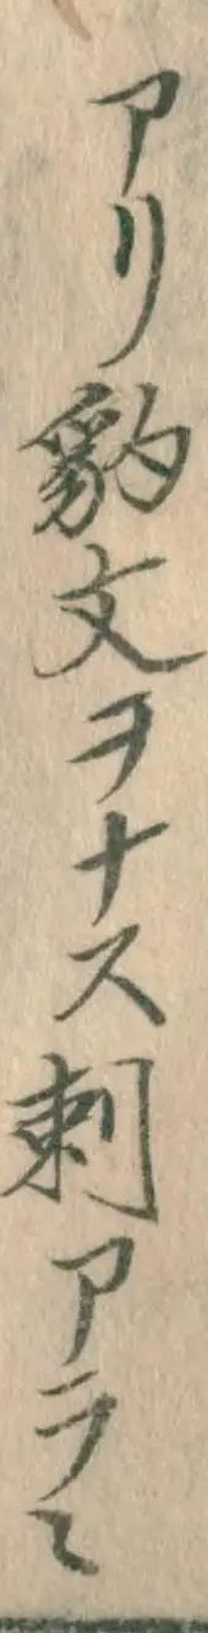アリ豹文ヲナス刺アラ々
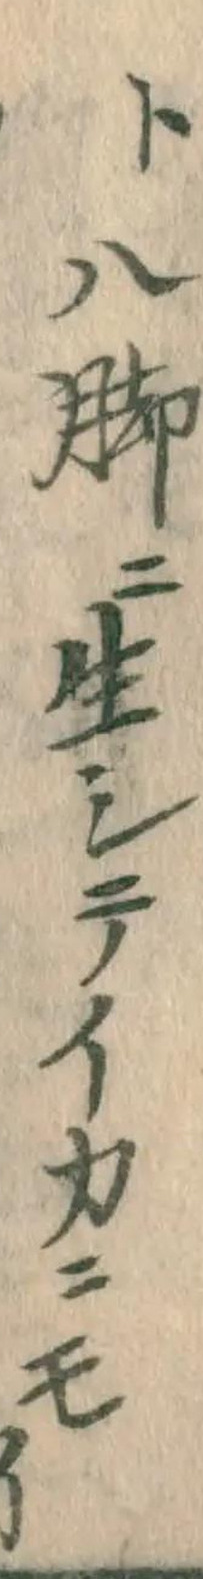ト八脚ニ生シテイカニモイ
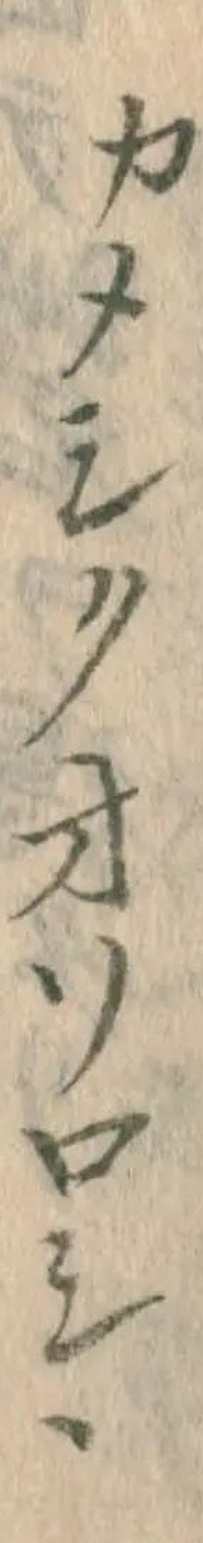カメシクオソロシヽ
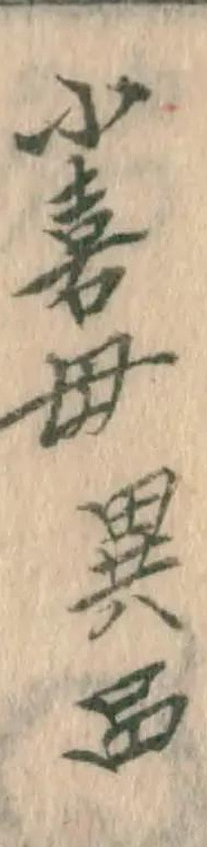小喜母異品
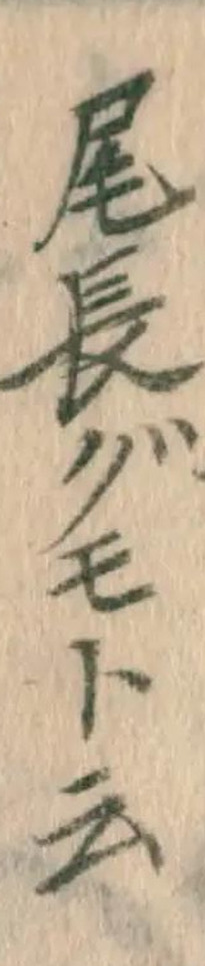尾長グモト云
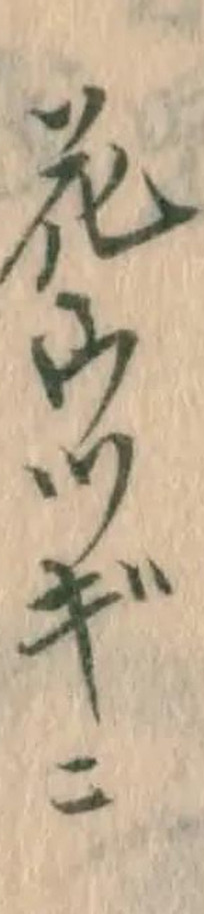花ウツギニ
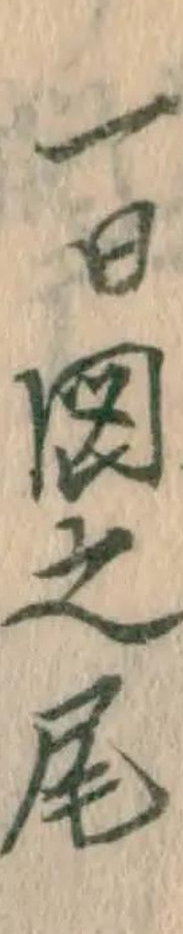一日図之尾
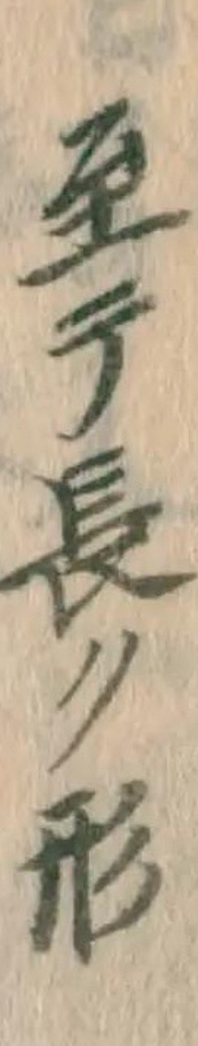至テ長ク形
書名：千蟲譜 3巻. [2]
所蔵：国立国会図書館 National Diet Library, JAPAN
